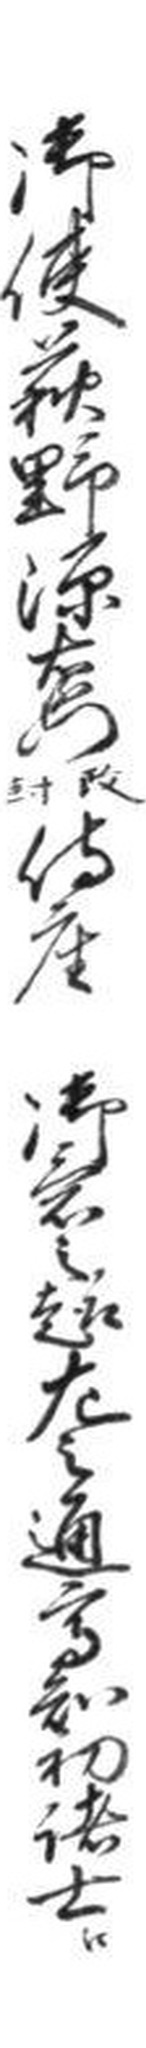御使萩野源右衛門政封侍座御意之趣左之通高知初諸士江
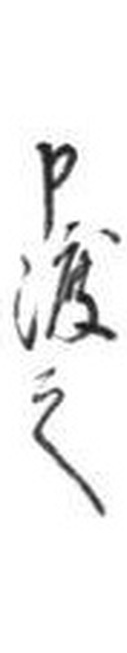申渡之
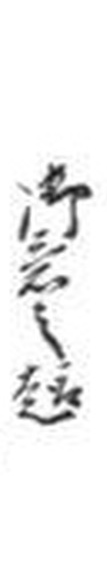御意之趣
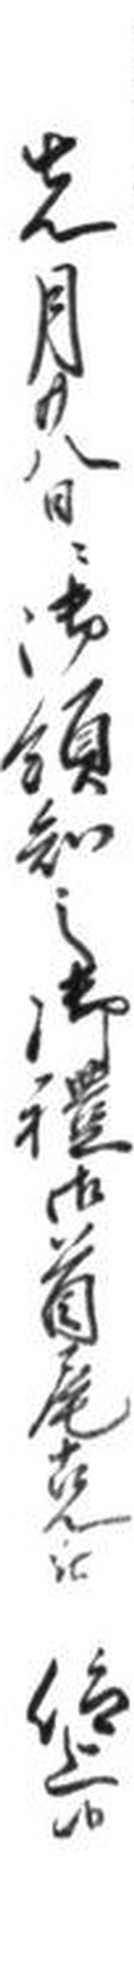先月廿八日ニ御領知之御礼御首尾克被仰上候
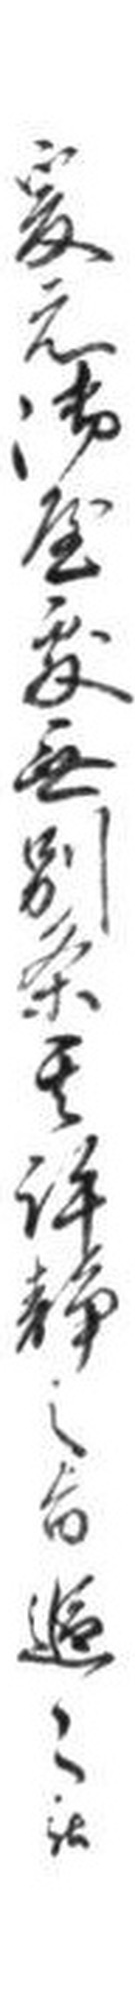爰元御屋敷無別条其許静之旨追々被
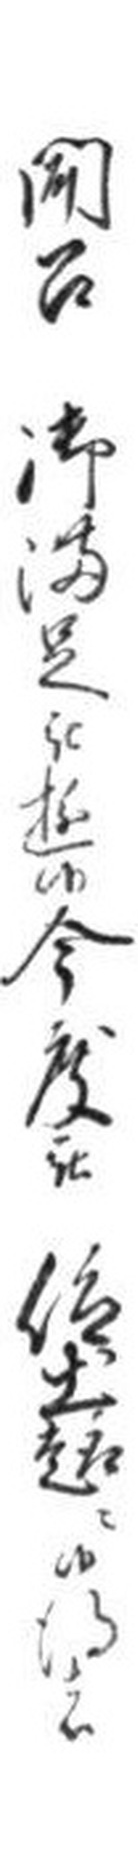聞召御満足被遊候今度被仰出趣ニ候得者
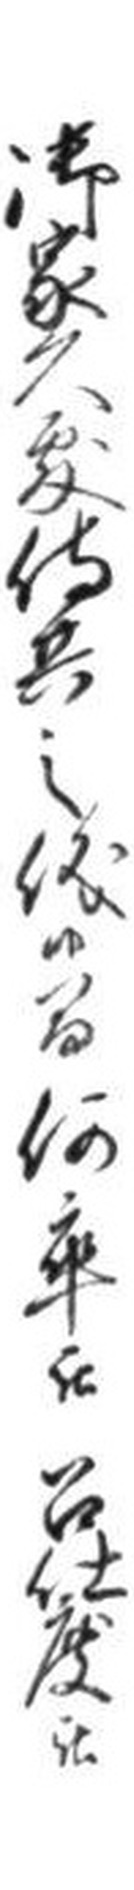御家久敷侍共之儀候間何卒被召仕度被
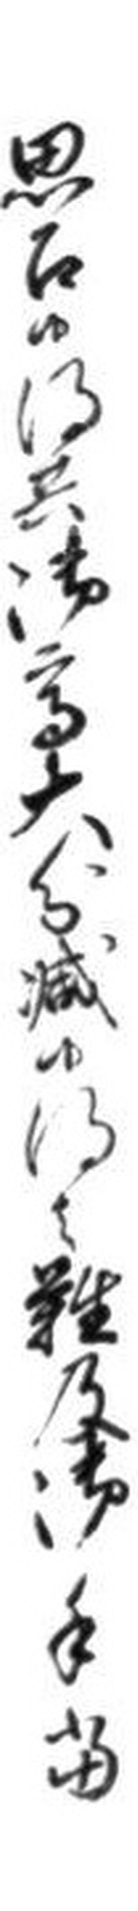思召候得共御高大分減候得者難及御手当
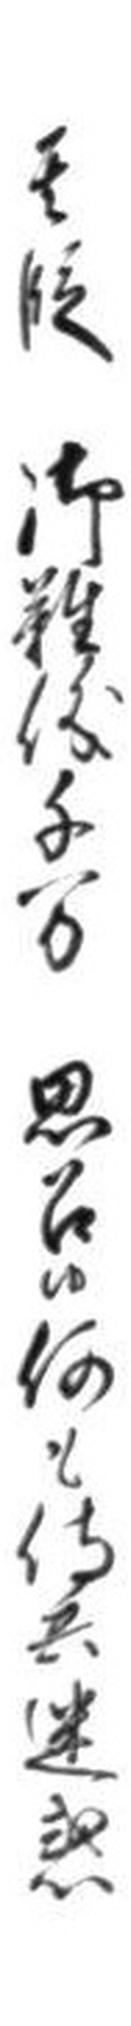其段御難儀千万思召候何も侍共迷惑
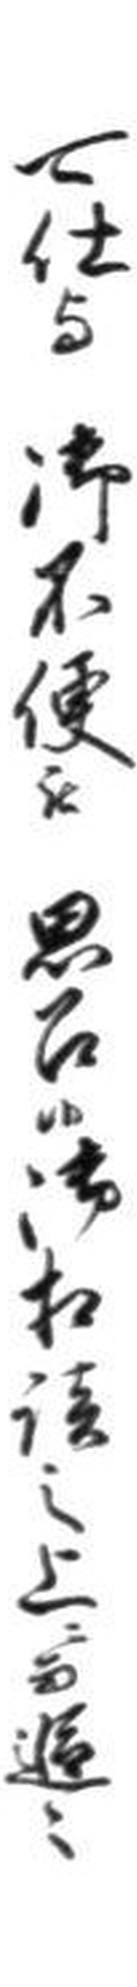可仕与御不便被思召候御相談之上ニ而追々
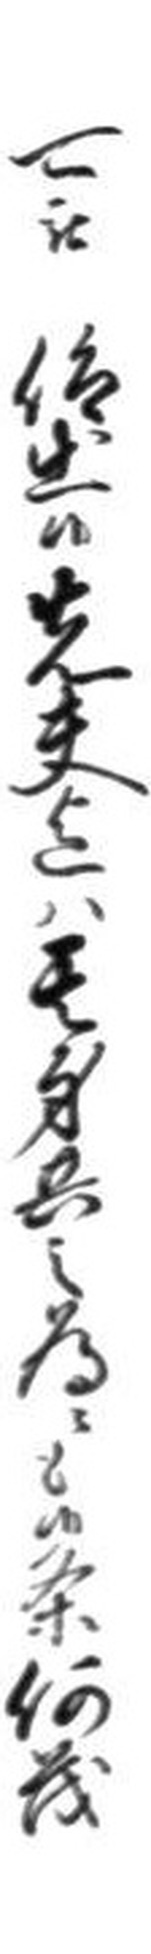可被仰出候先夫迄ハ其身共之為ニも候条何茂
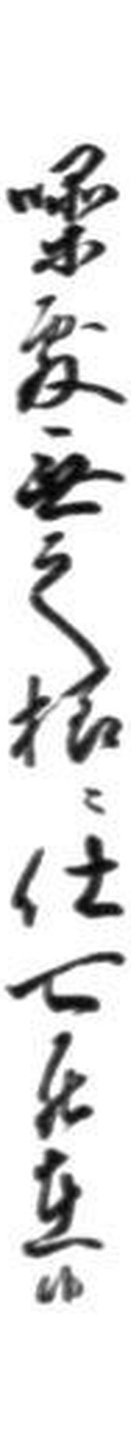噪敷無之様ニ仕可罷在候
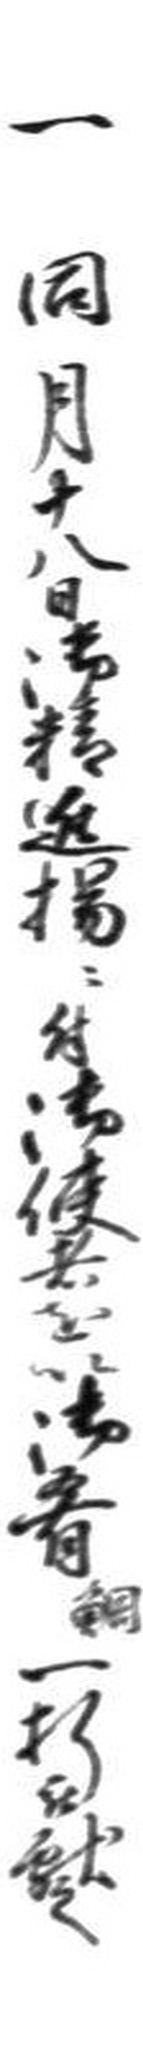一同月十八日御精進揚ニ付御使者を以御肴鯛一折被献之
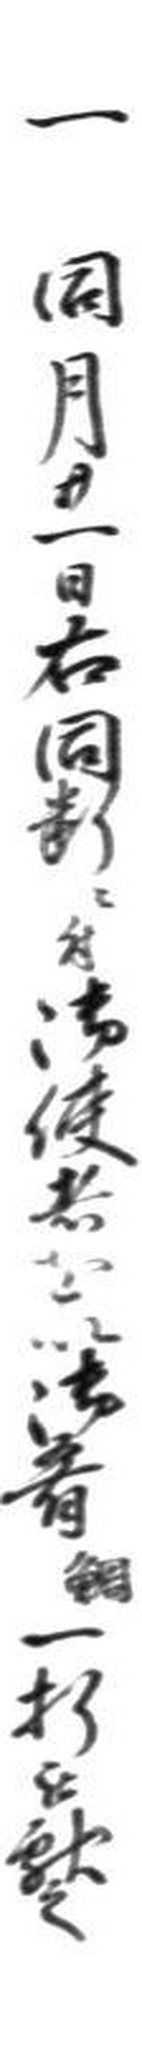一同月廿一日右同断ニ付御使者を以御肴鯛一折を献之
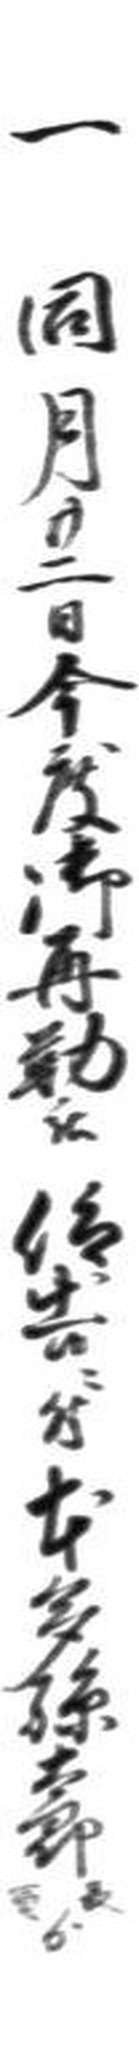一同月廿二日今度御再動被仰出候ニ付本多孫太郎長員ゟ
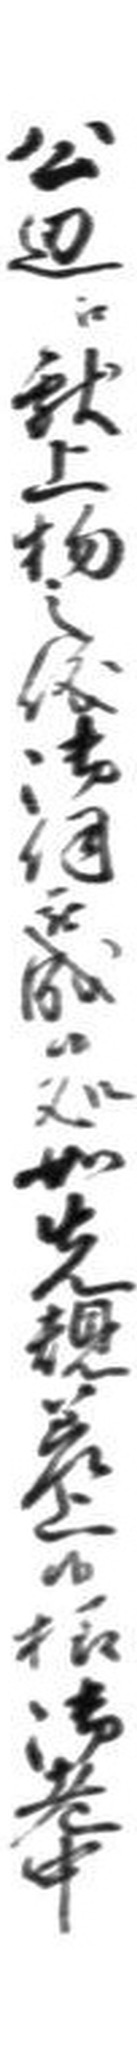公辺江献上物之儀御伺被成候処如先規差上候様御老中
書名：家譜 十六 吉品公 従貞享三年閏三月到同四年
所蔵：福井県文書館 Fukui Prefectural Archives
